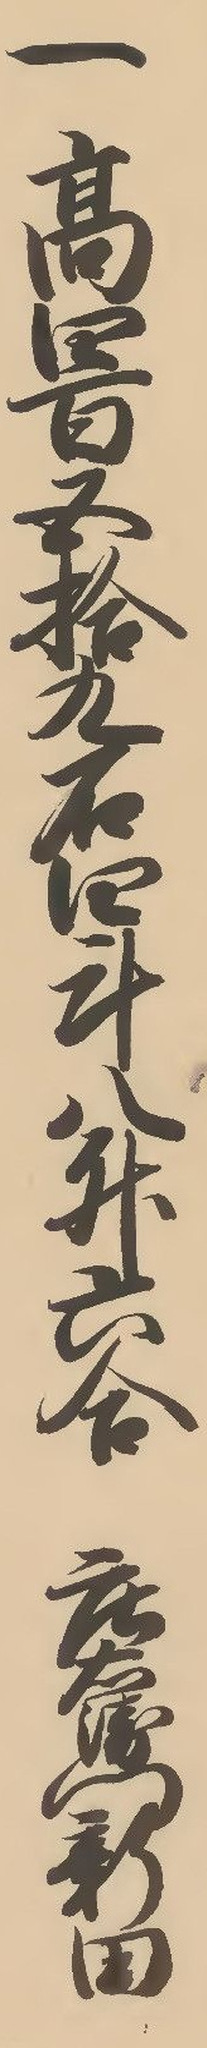一高四百五拾九石四斗八升六合庄右衛門新田
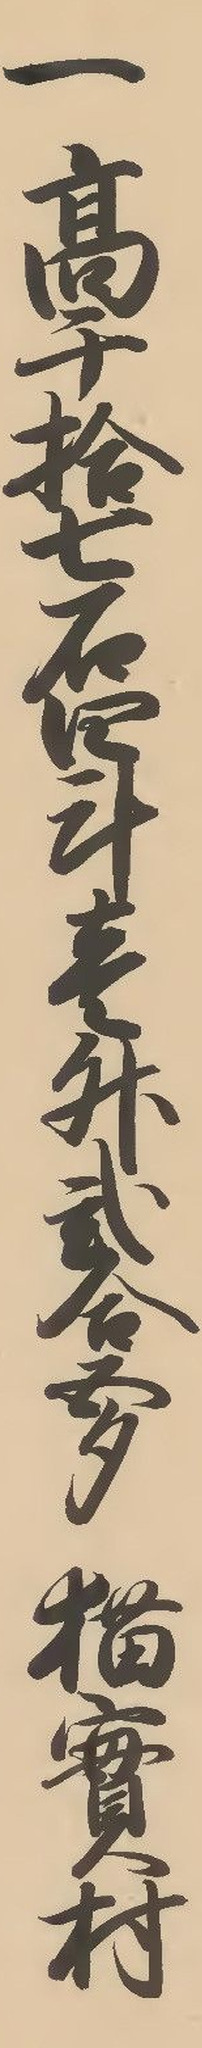一高千拾七石四斗壱升弐合五勺猫実村
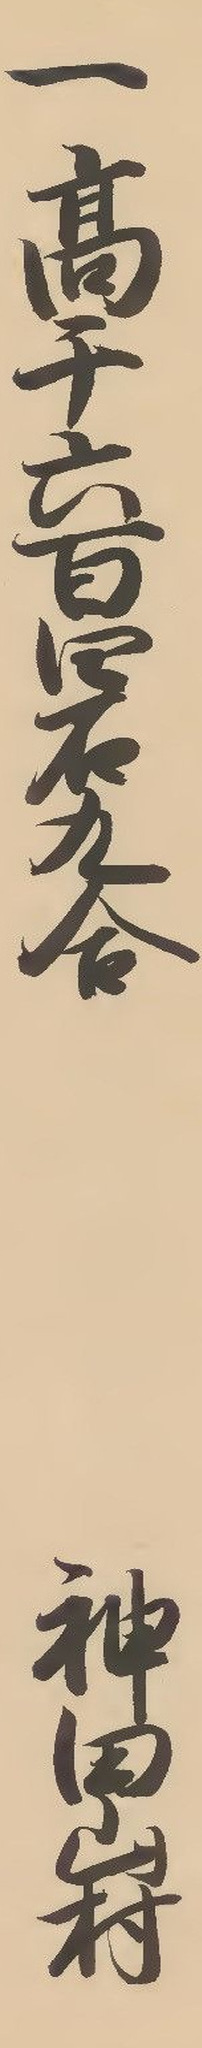一高千六百四石九合神田山村
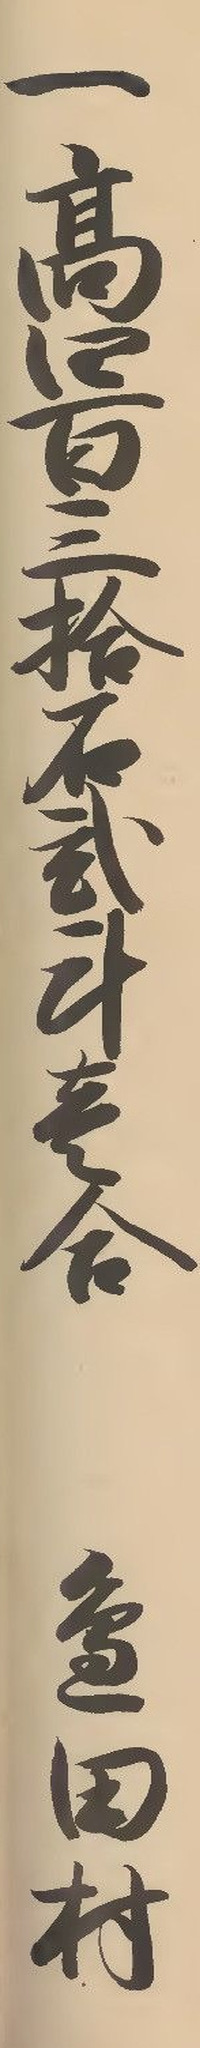一高四百三拾石弐斗壱合辺田村
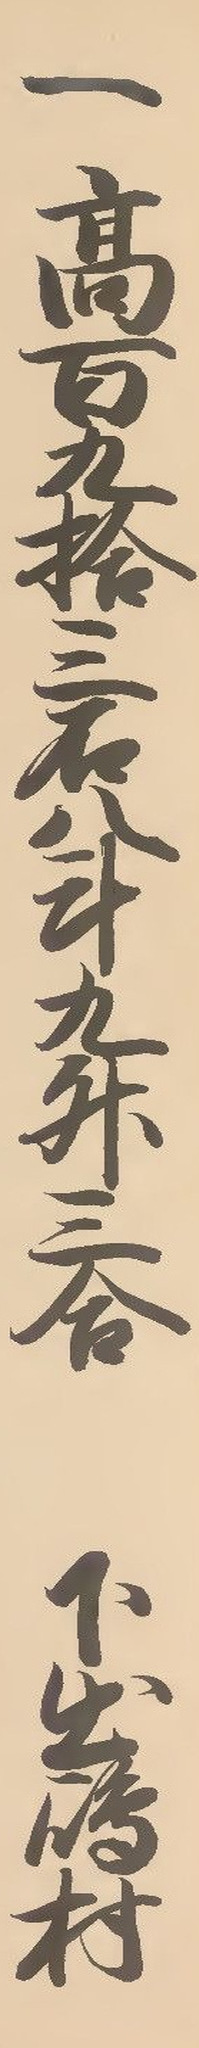一高百九拾三石八斗九升三合下出島村
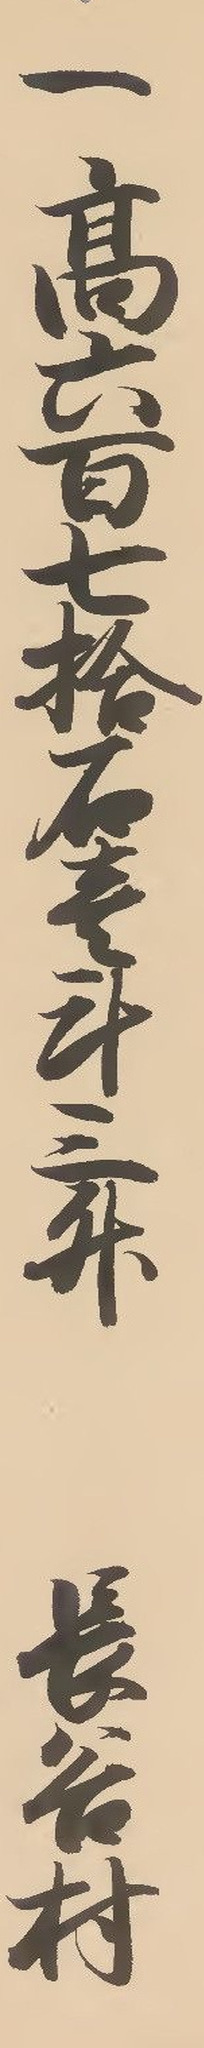一高六百七拾石壱斗三升長谷村
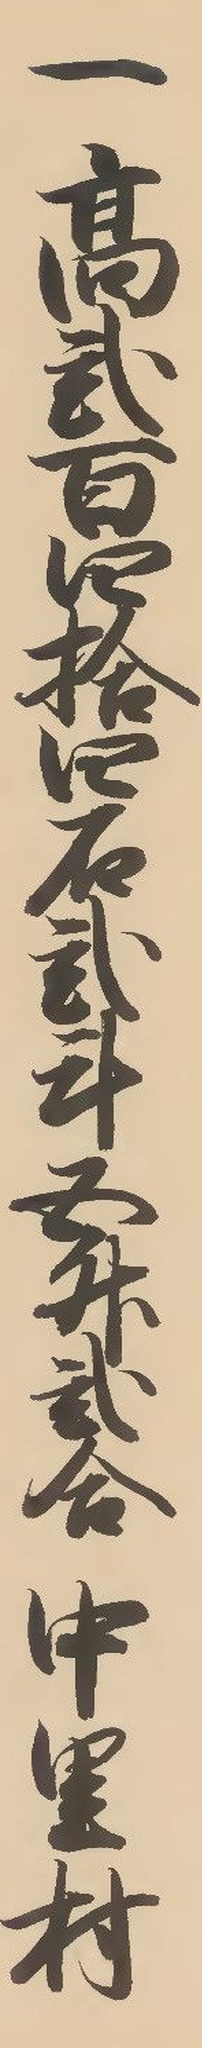一高弐百四拾四石弐斗五升弐合中里村
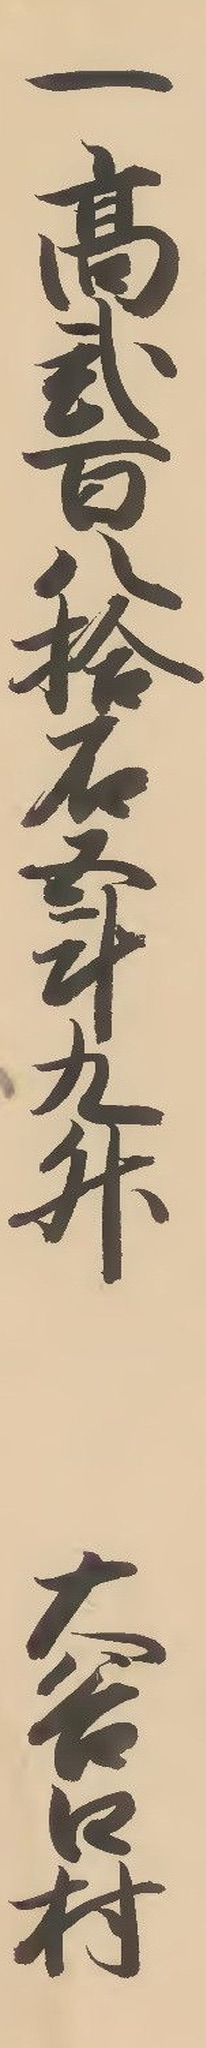一高弐百八拾石五斗九升大谷口村

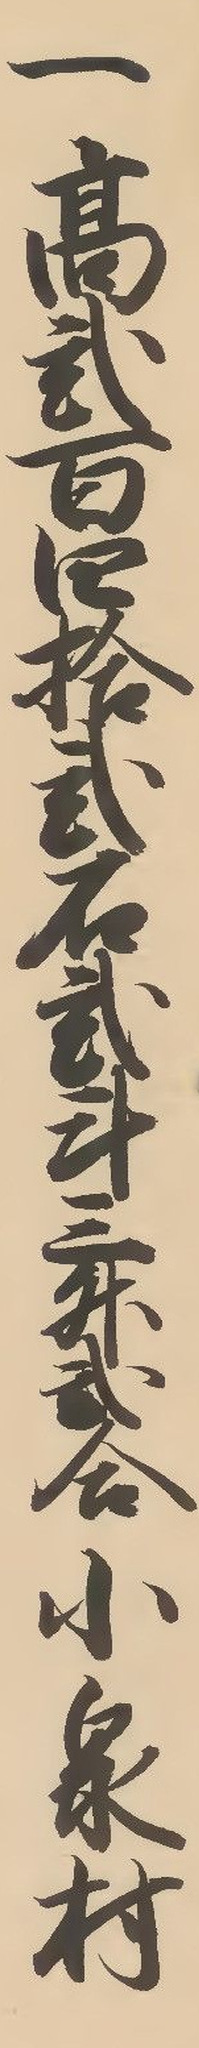一高弐百四拾弐石弐斗三升弐合小泉村
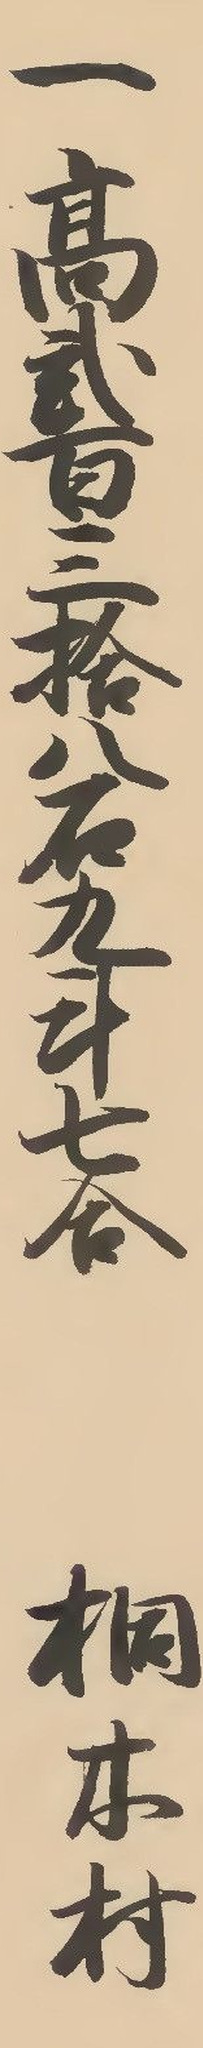一高弐百三拾八石九斗七合桐木村
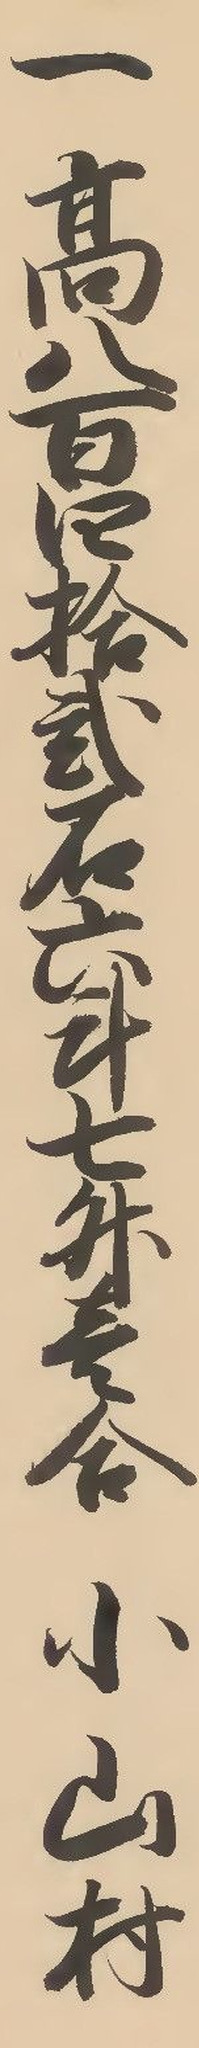一高八百四拾弐石六斗七升壱合小山村
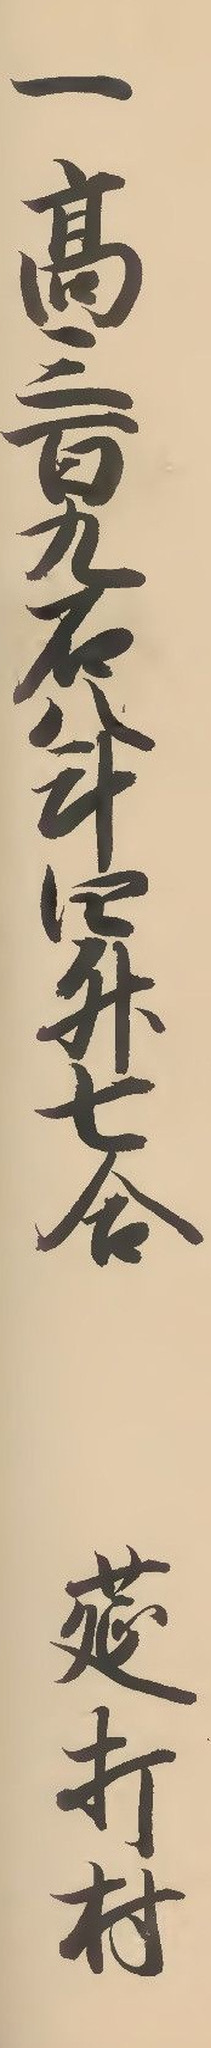一高三百九石八斗四升七合莚打村
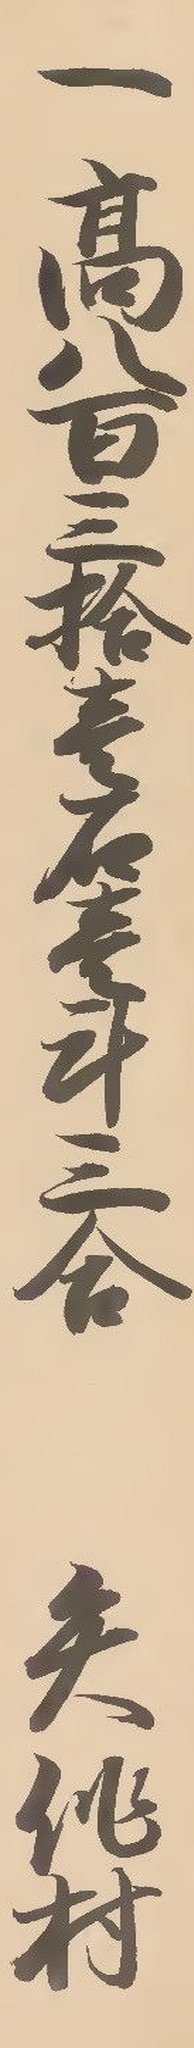一高八百三拾壱石壱斗三合矢作村
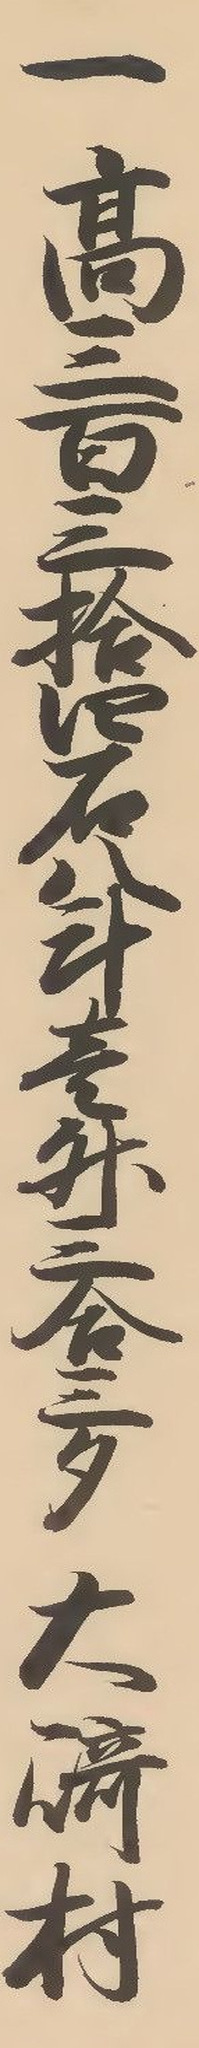一高三百三拾四石八斗壱升三合三勺大崎村
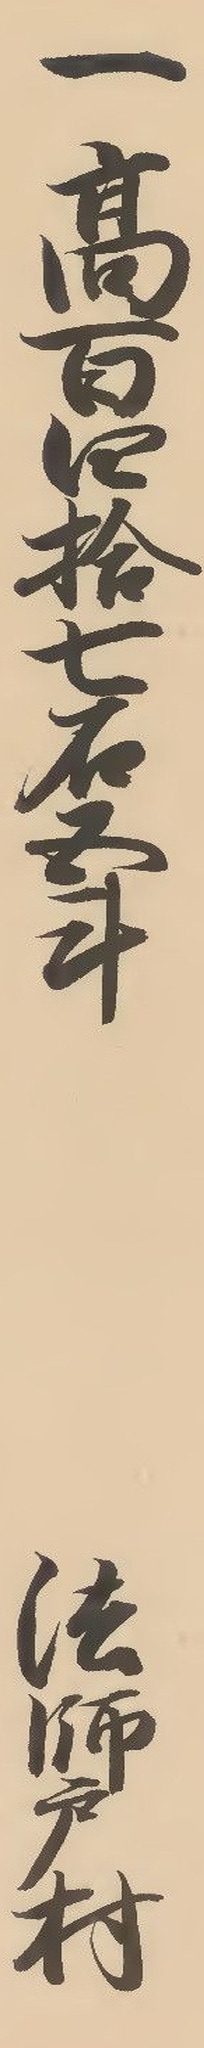一高百四拾七石五斗法師戸村
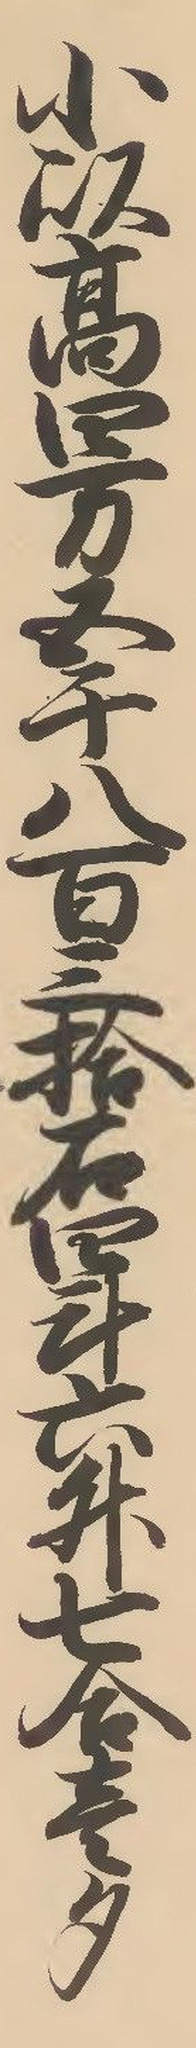小以高四万五千八百三拾石四斗六升七合壱勺
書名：下総国郷帳
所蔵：国立公文書館 National Archives of Japan
